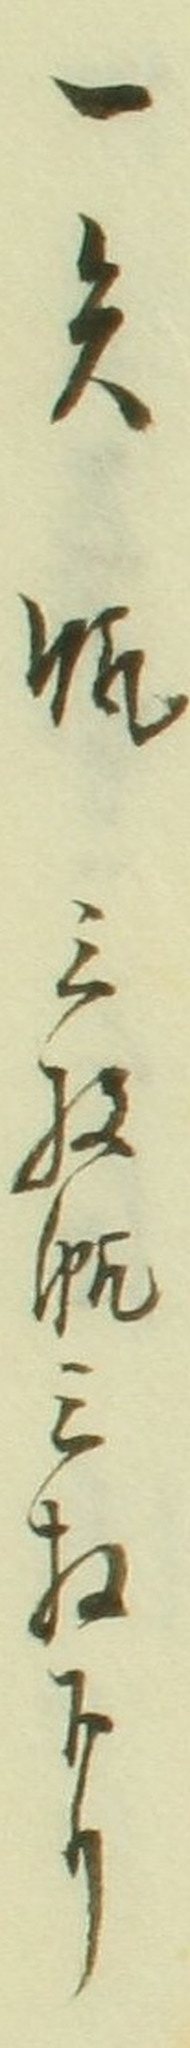一矢帆三枚帆三相下り
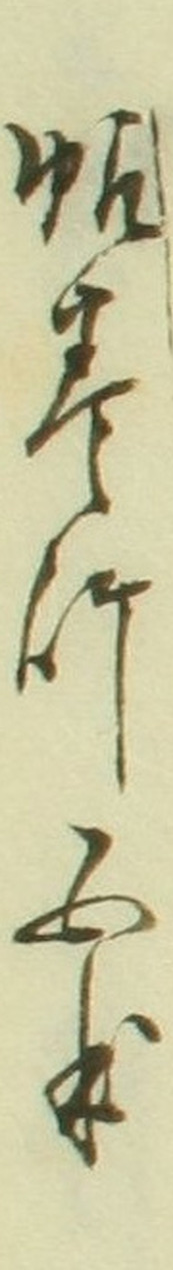帆巻竹五本
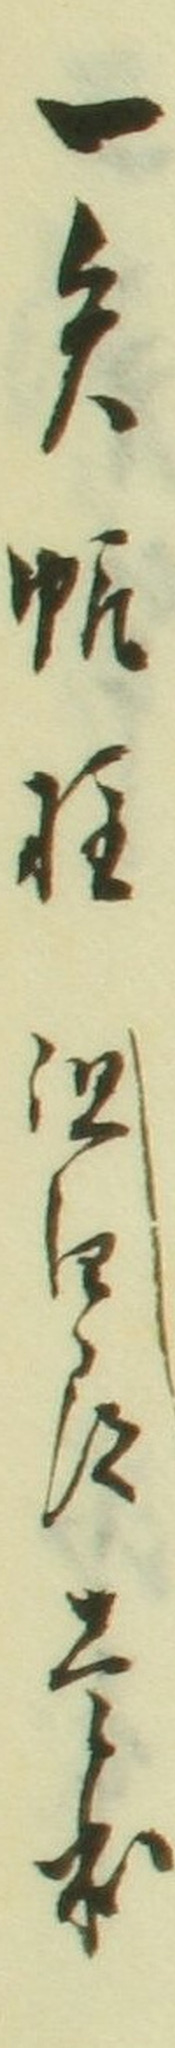一矢帆柱但四尋壱本

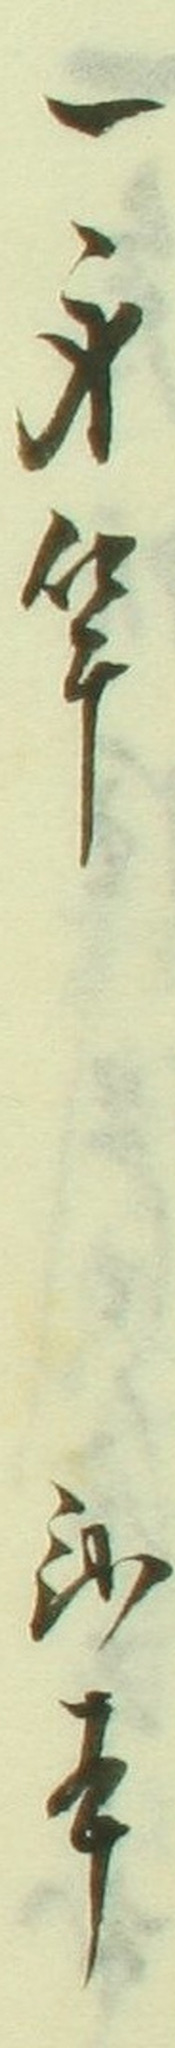一身竿弐本
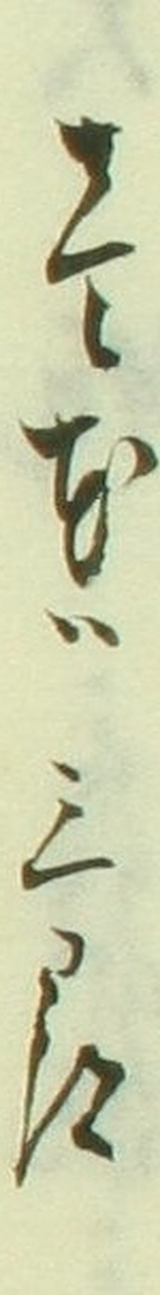壱本ハ三尋
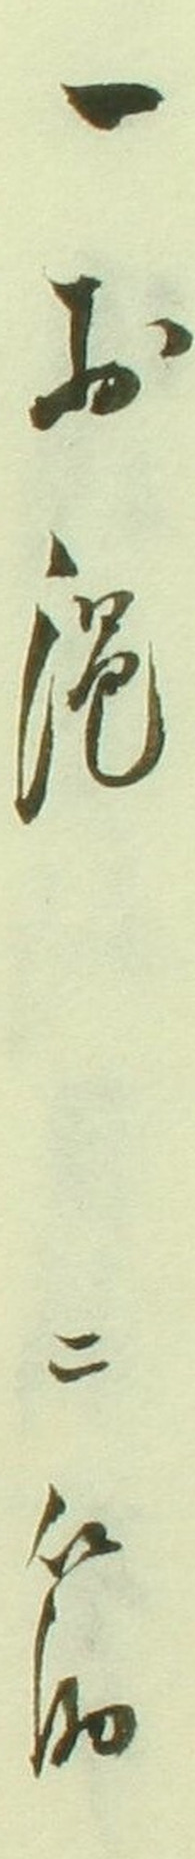一お縄二筋
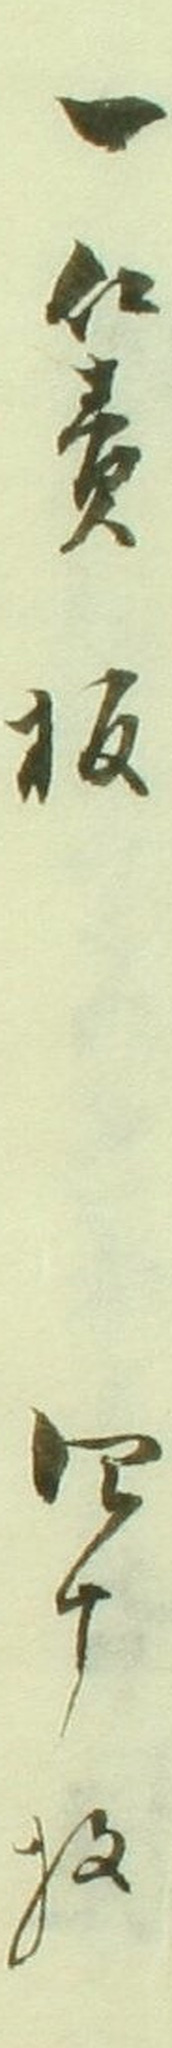一簀板四十枚
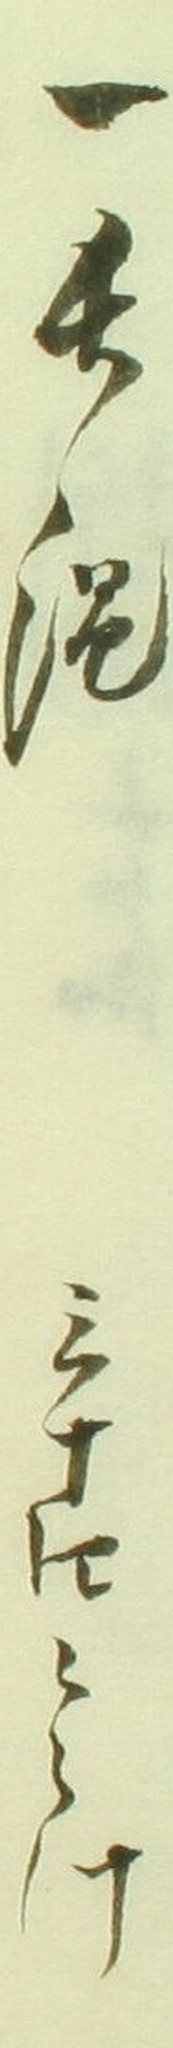一長縄三十四ろけ
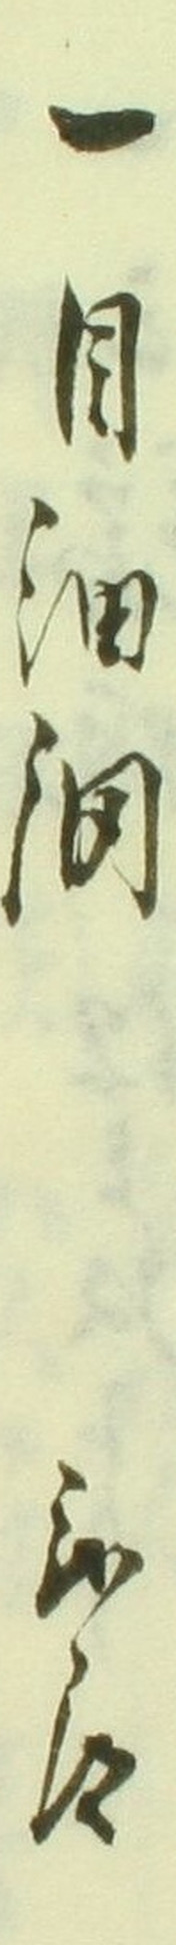一目細網弐尋
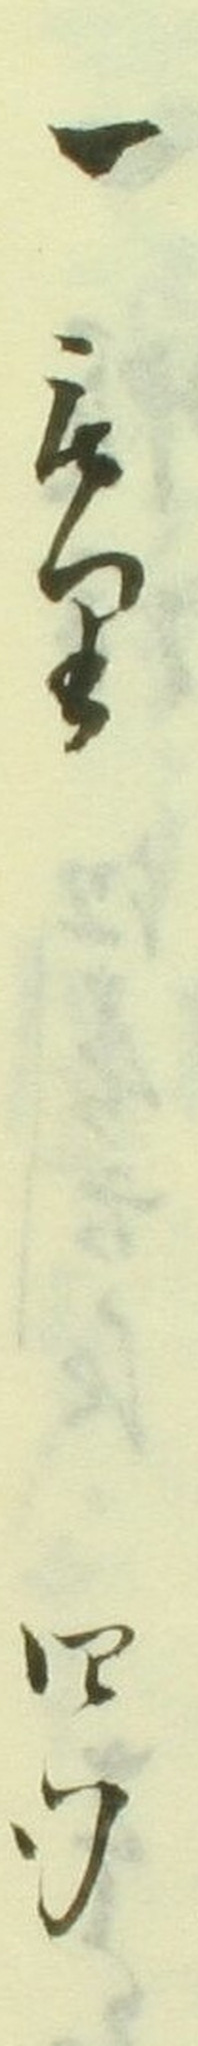一もり四ツ
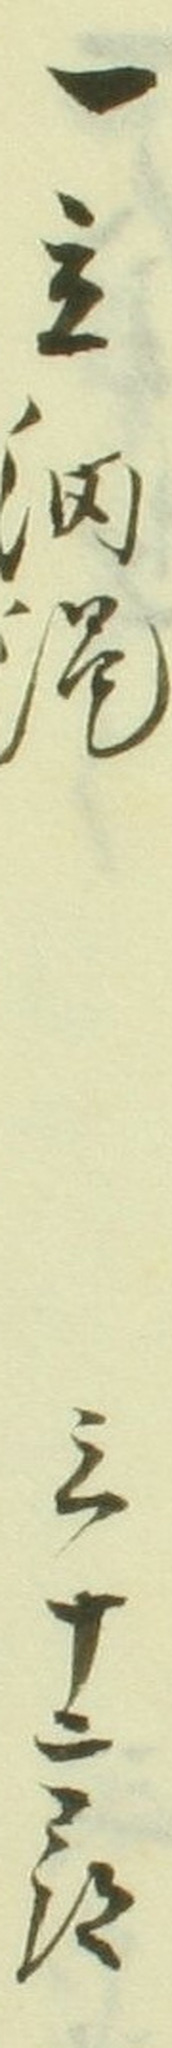一立網縄三十二尋
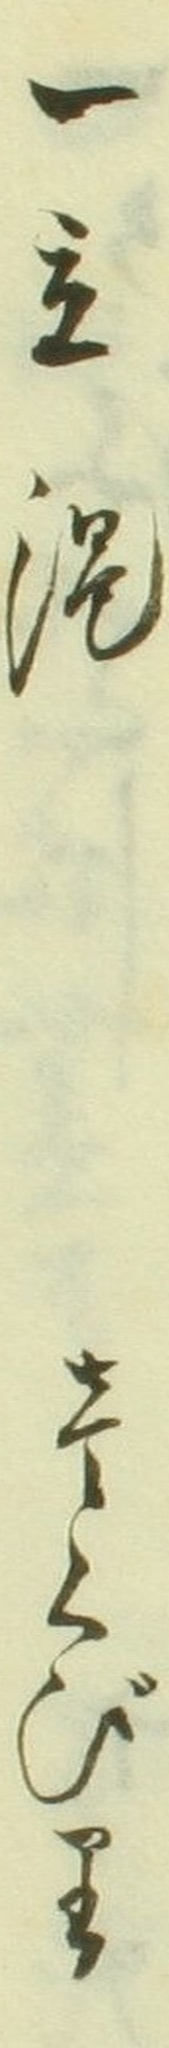一立縄壱くびり
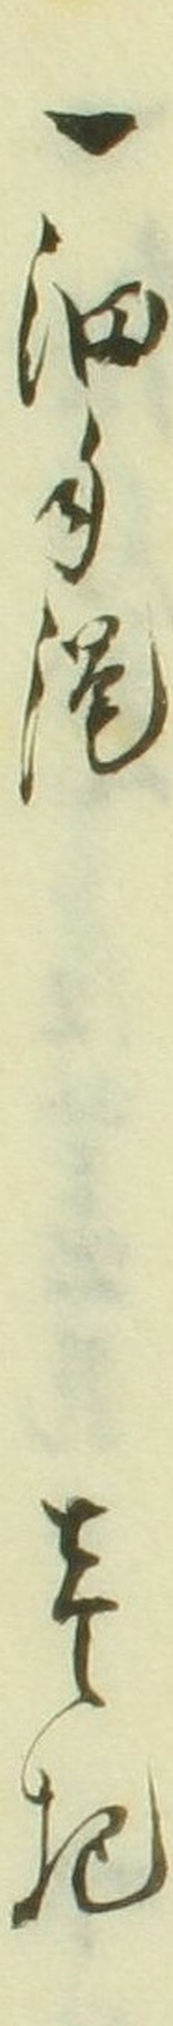一細手縄壱把
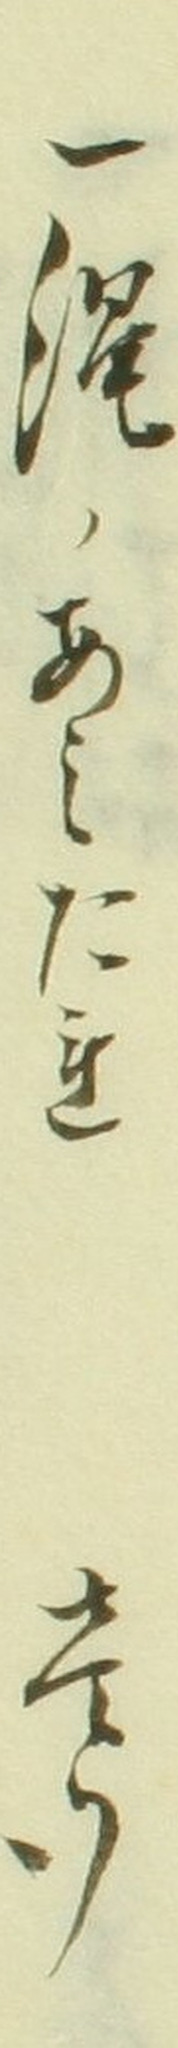一縄ノあみたれ壱ツ
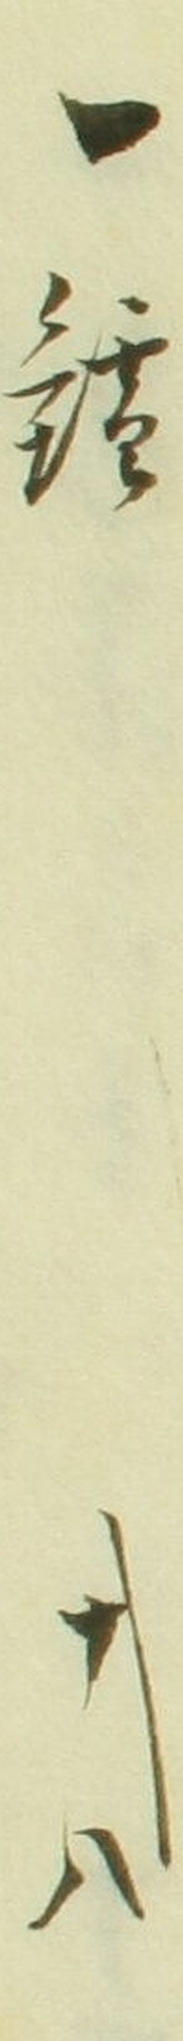一鱈十八
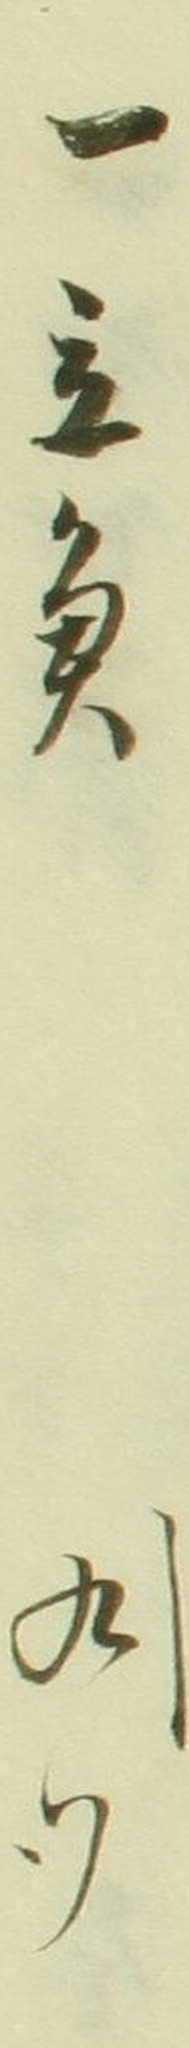一立魚九ツ
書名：異国船漂着記
